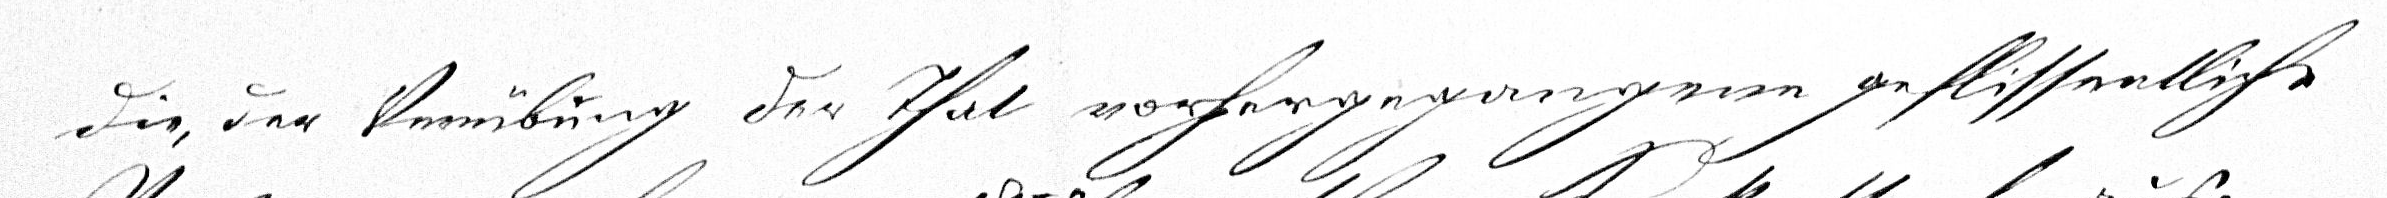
die, der Verübung der Thal vorhergegangene geflissentliche
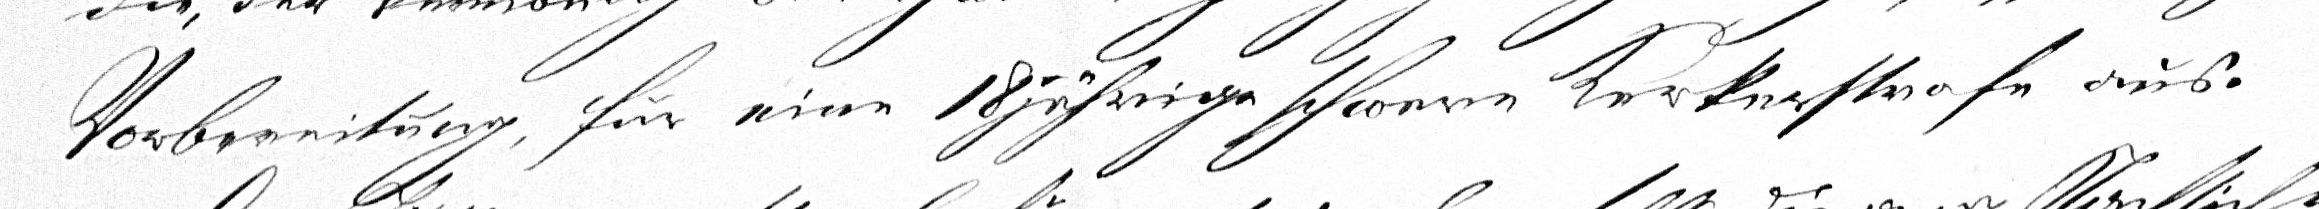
Vorbereitung, für eine 18jährige schwere Kerkerstrafe aus.
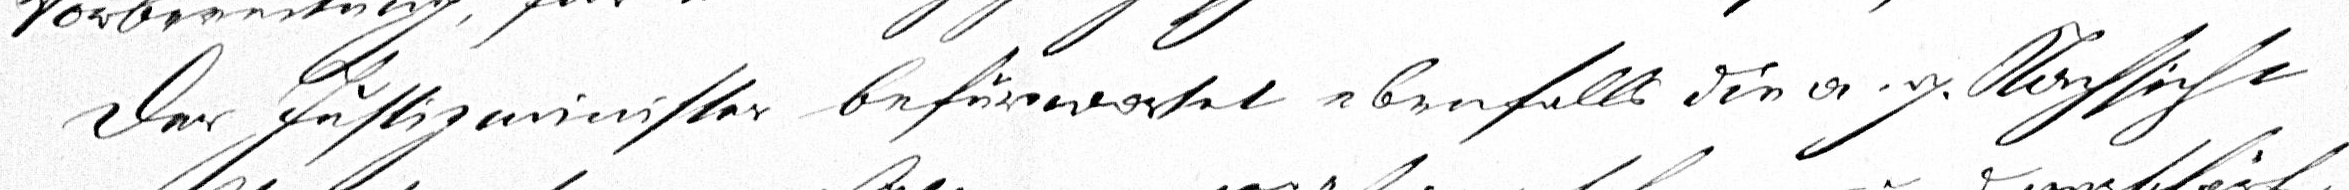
Der Justizminister befürwortet ebenfalls die a. g. Nachsicht
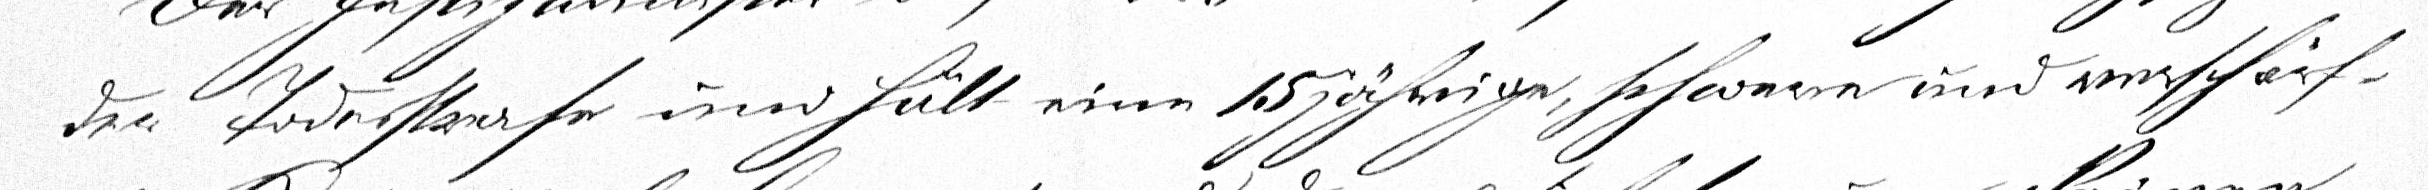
der Todesstrafe und hält eine 15jährige, schwere und verschärf¬
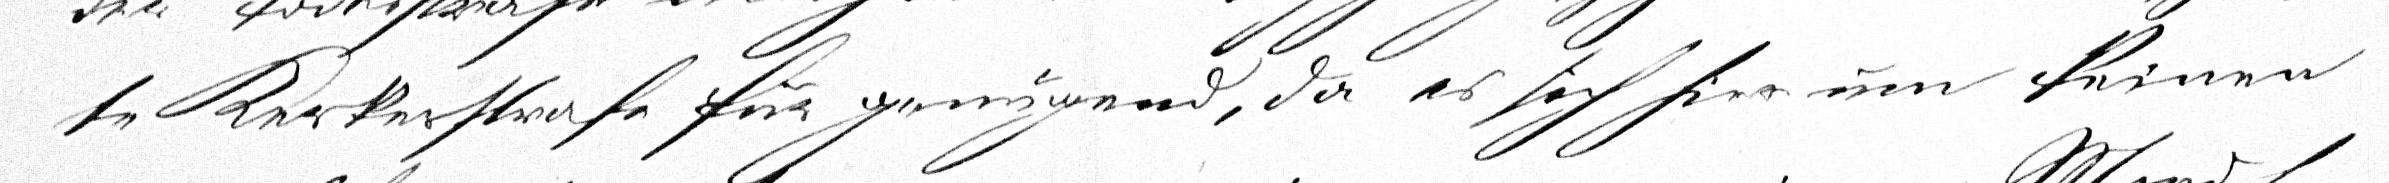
te Kerkerstrafe für genügend, da es sich hier um keinen
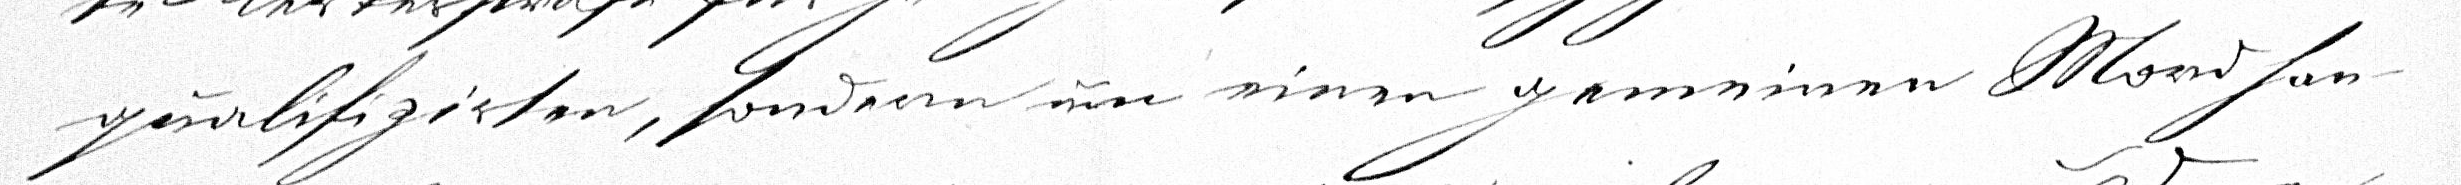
qualifizirten, sondern um einen gemeinen Mordhan¬
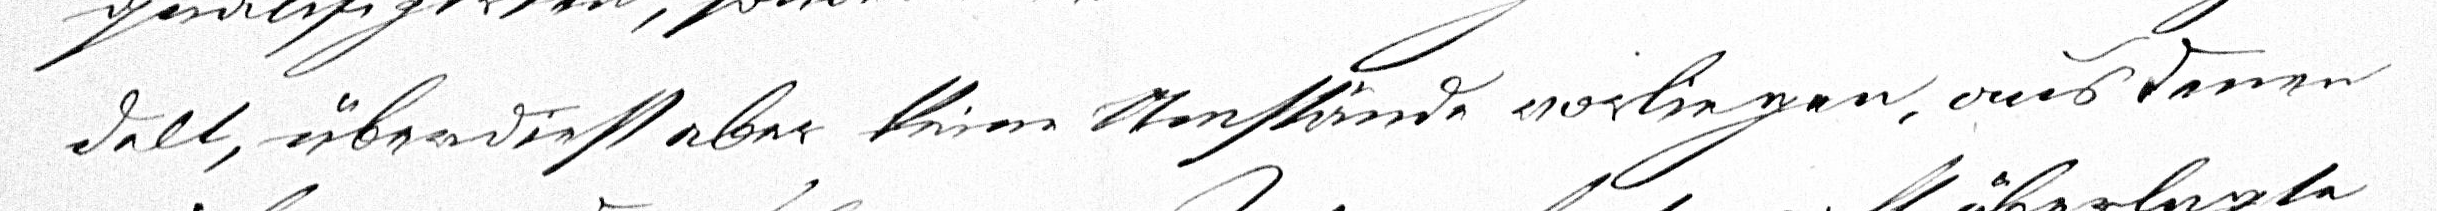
delt, überdieß aber keine Umstände vorliegen, aus denen
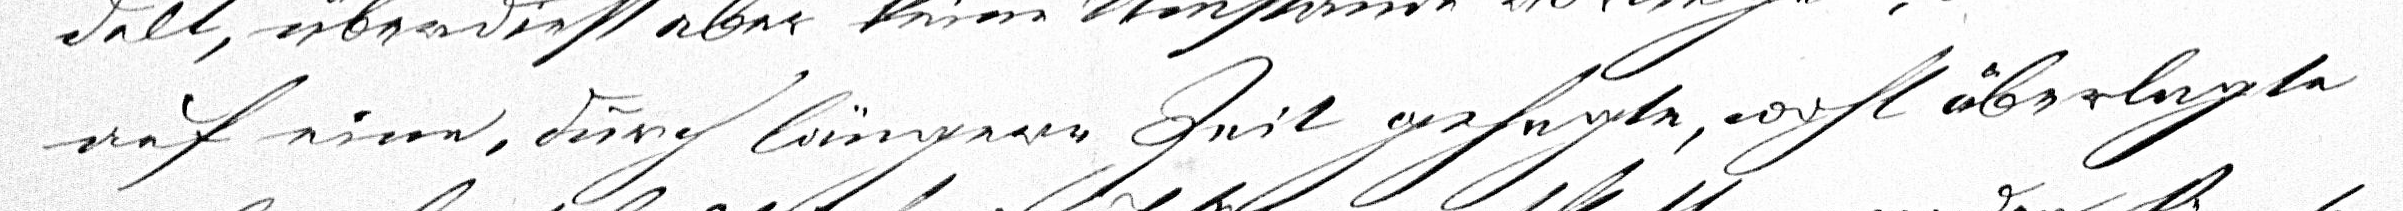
auf eine, durch längere Zeit gehegte, wohl überlegte
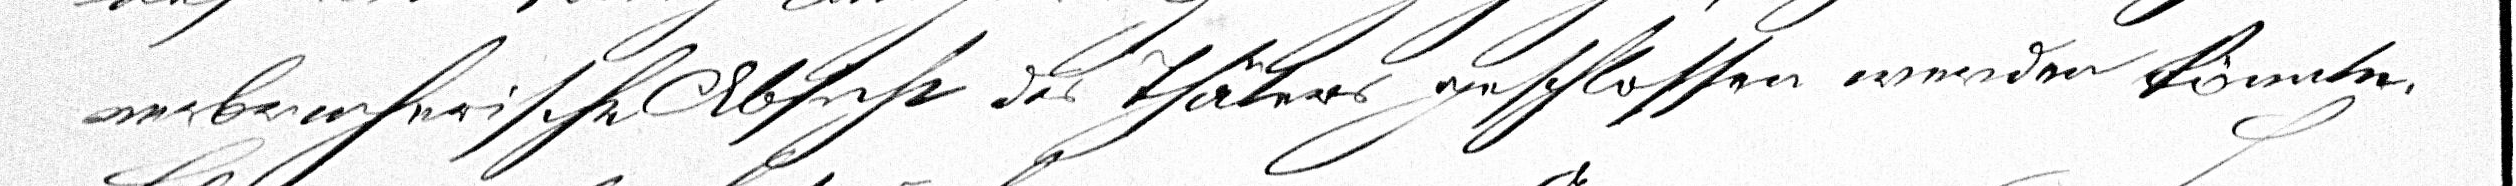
verbrecherische Absicht das Thäters geschlossen werden könnte,
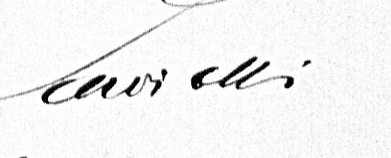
xx
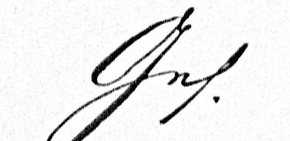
Ges.
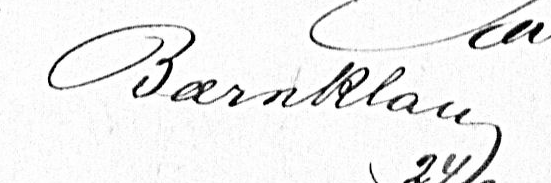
Barnklau
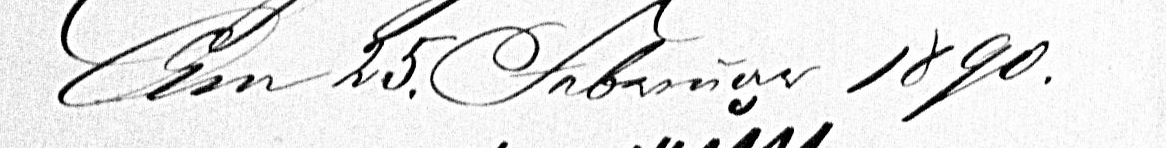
Am 25. Februar 1890.
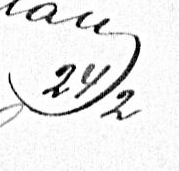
2½
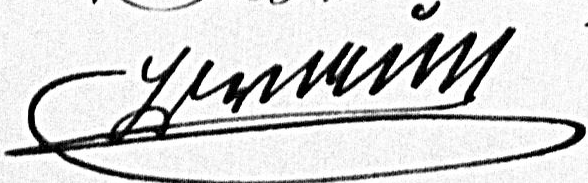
xx
